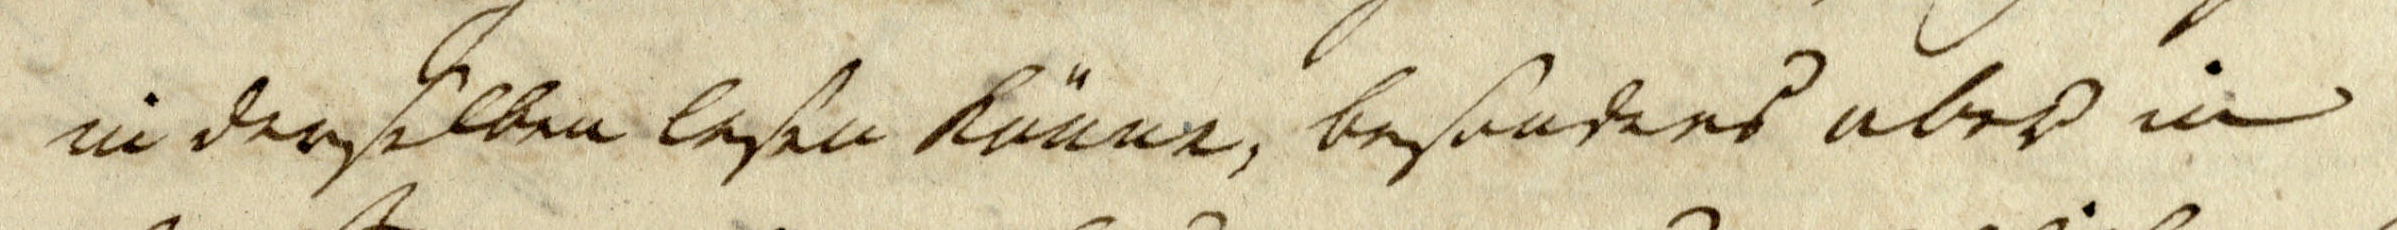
in derselben lesen könne, besonders aber in
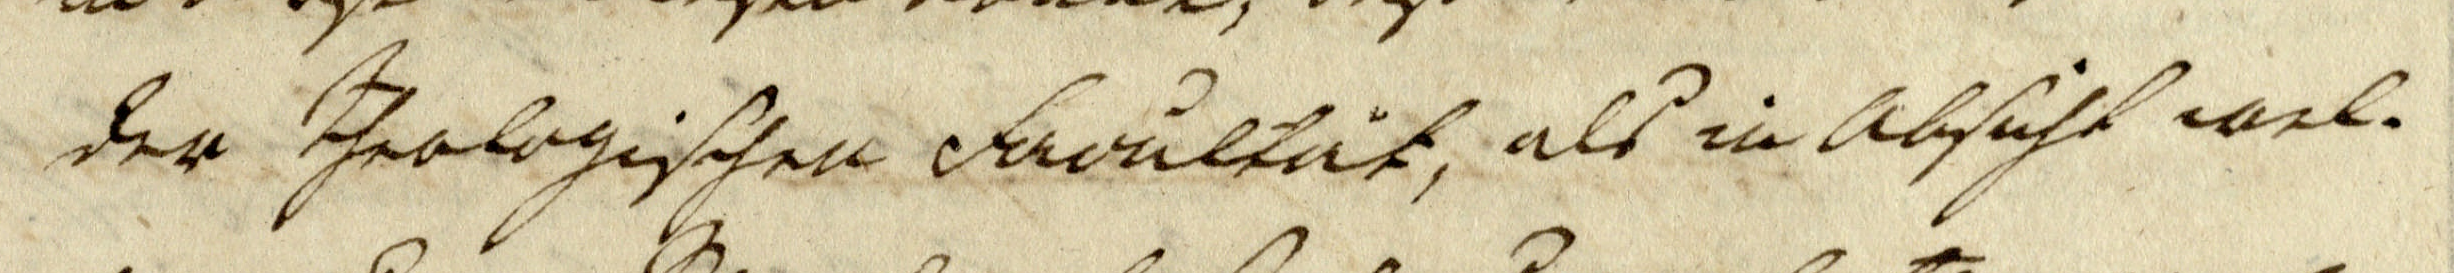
der Theologischen Facultät, als in Absicht wel¬
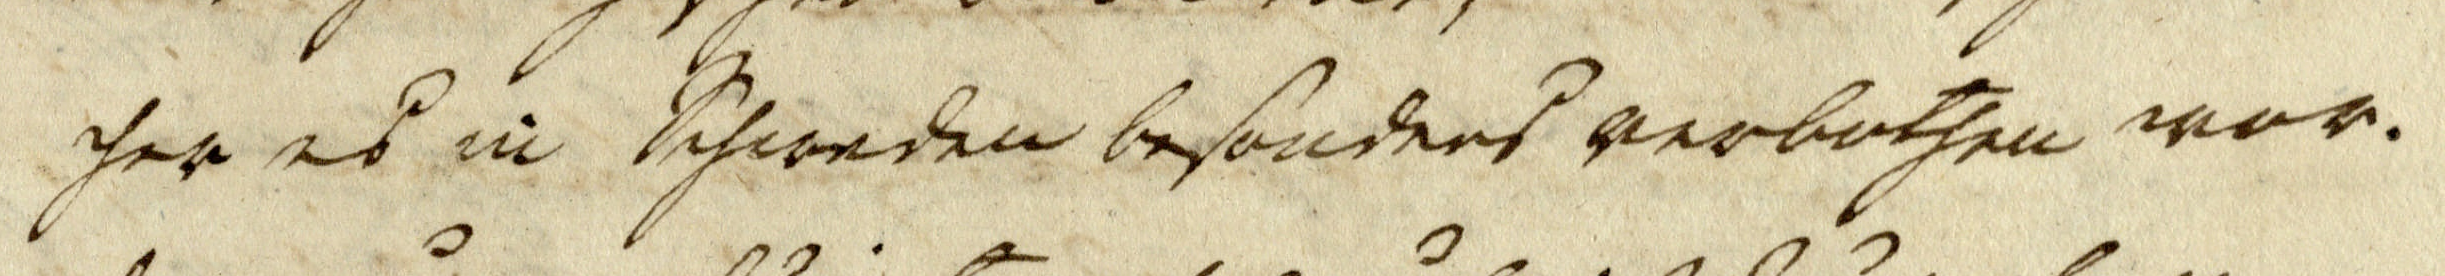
cher es in Schweden besonders verbothen wor¬
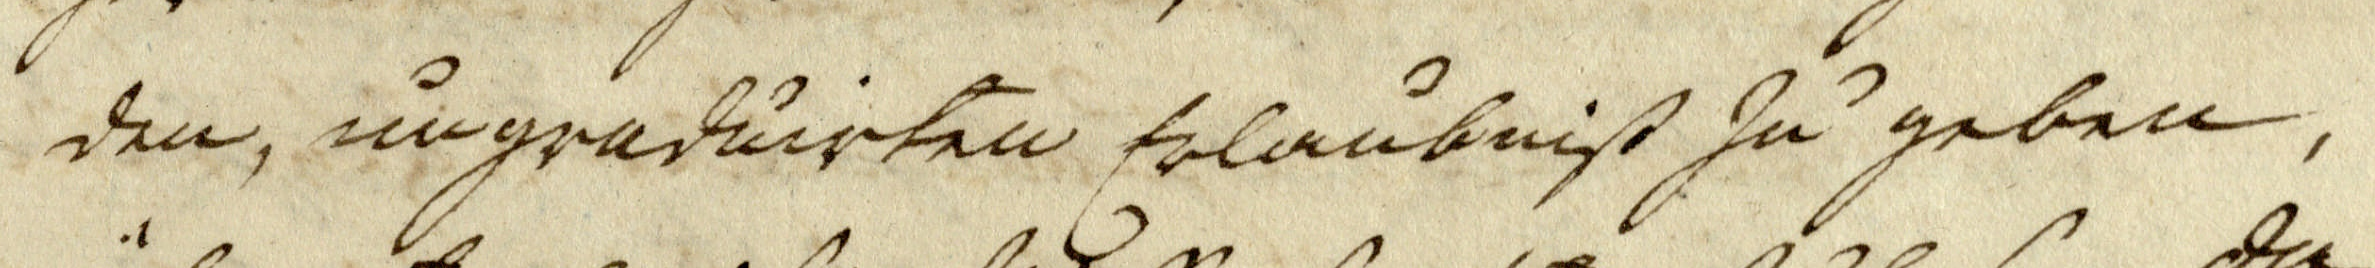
den, ungraduirten Erlaubniß zu geben,
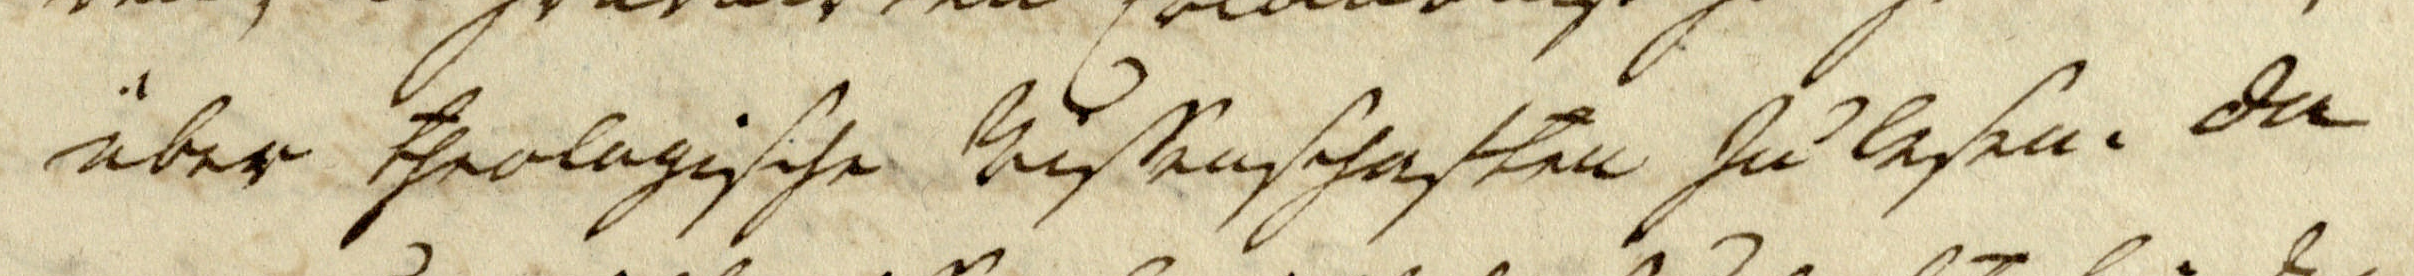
über theologische Wissenschaften zu lesen. Da
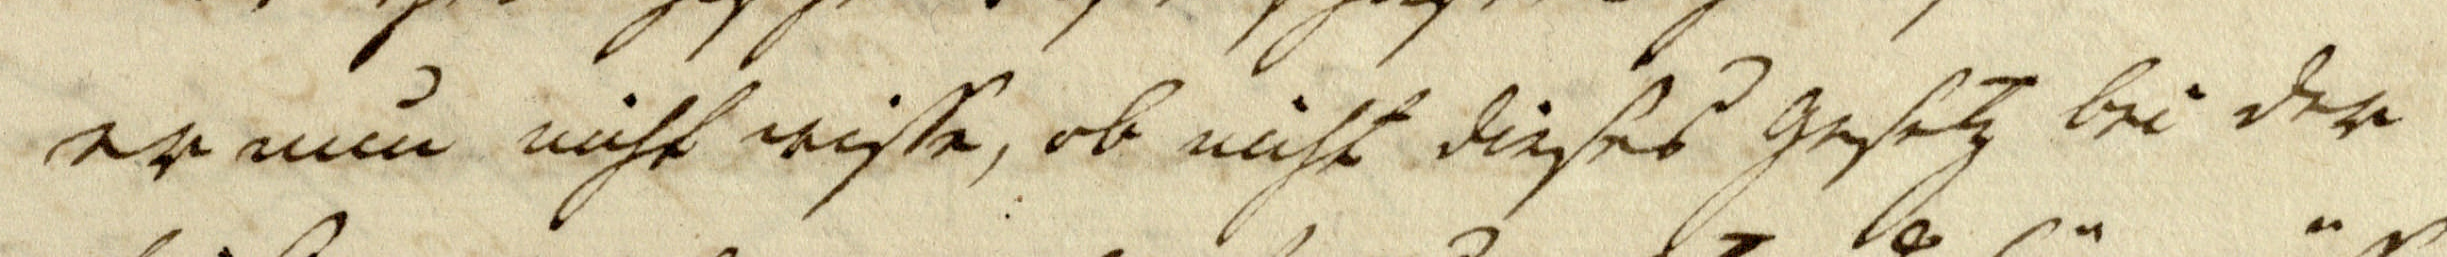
er nun nicht wisse, ob nicht dieses Gesetz bei der
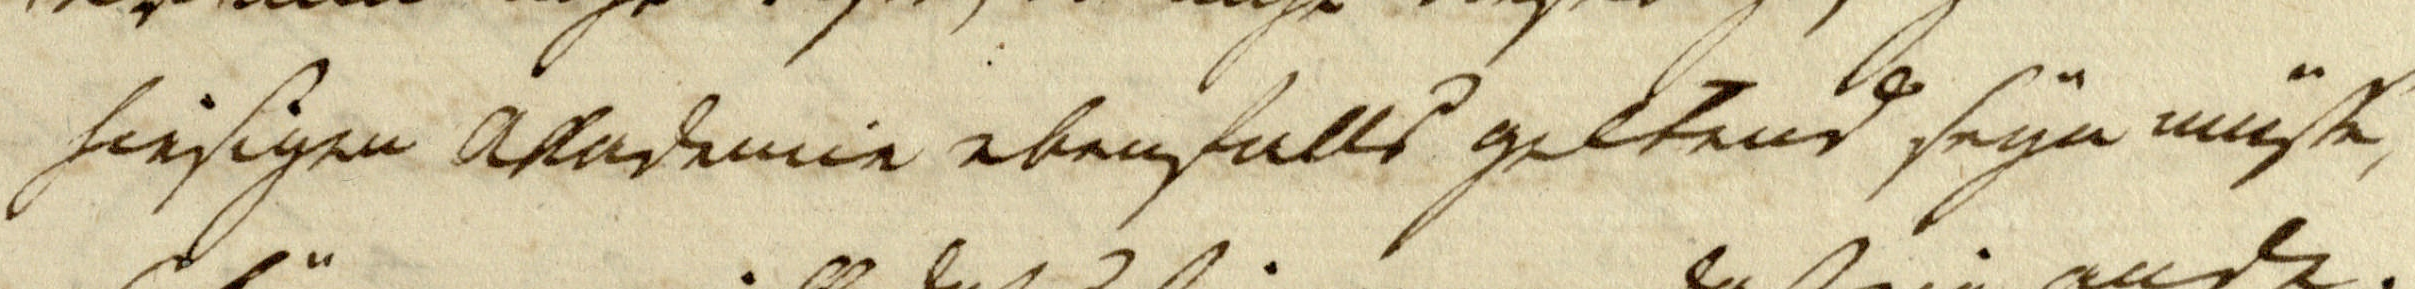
hiesigen Akademie ebenfalls geltend seÿn müsse,
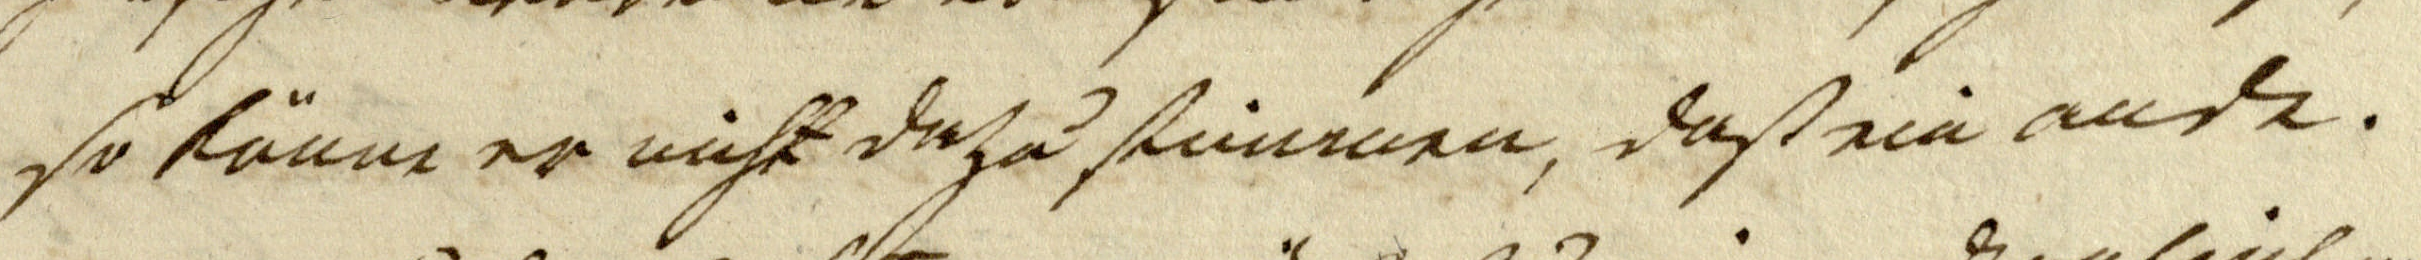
so könne er nicht dazu stimmen, daß ein ande¬
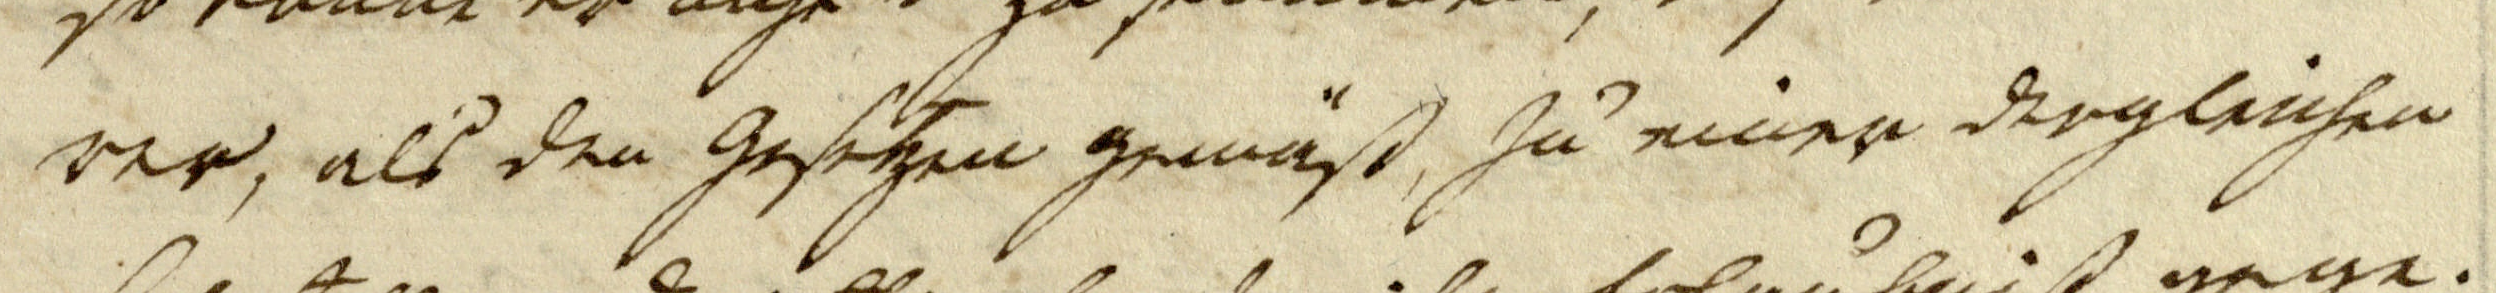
rer, als den Gesetzen gemäß, zu einer dergleichen
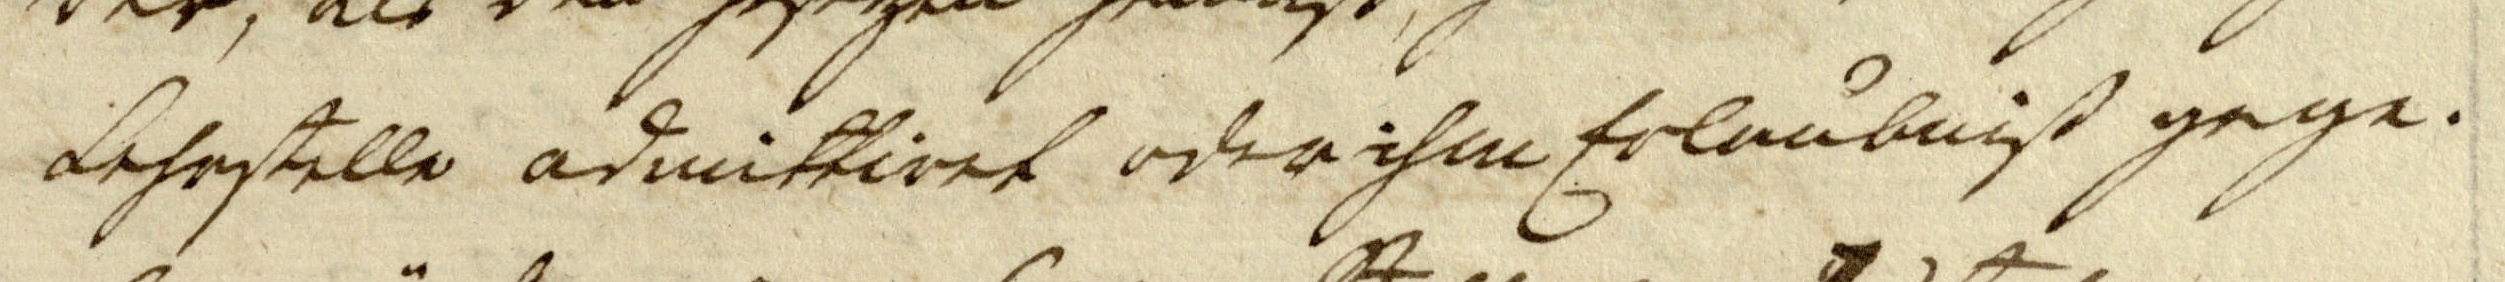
Lehrstelle admittiret oder ihm Erlaubniß gege¬
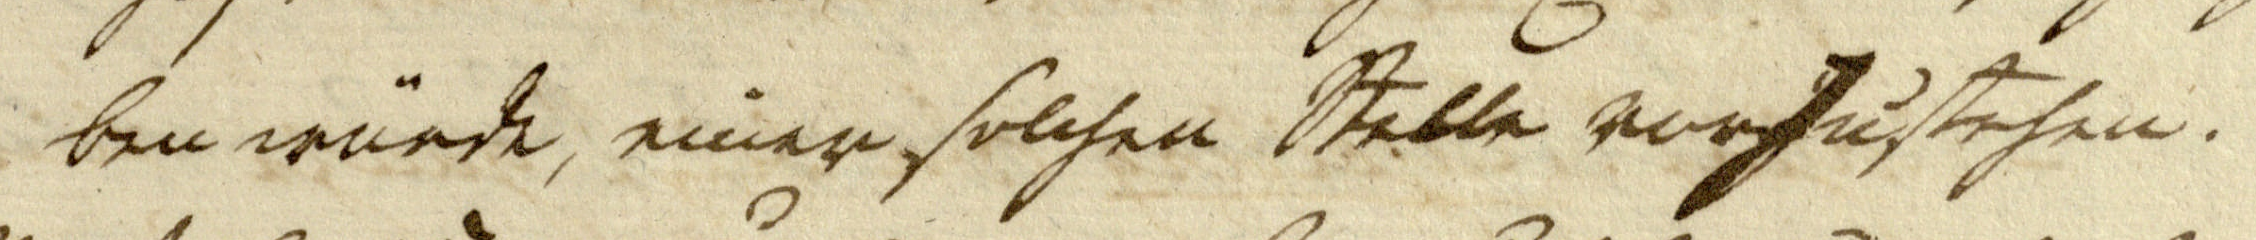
ben würde, einer solchen Stelle vorzustehen.
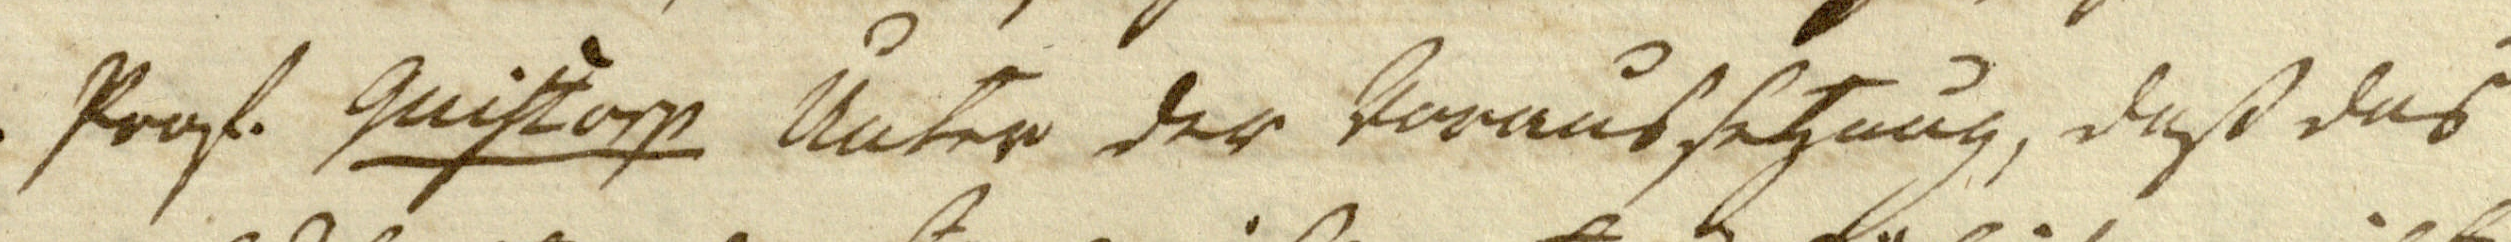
Prof. Quistorp Unter der Voraussetzung, daß das
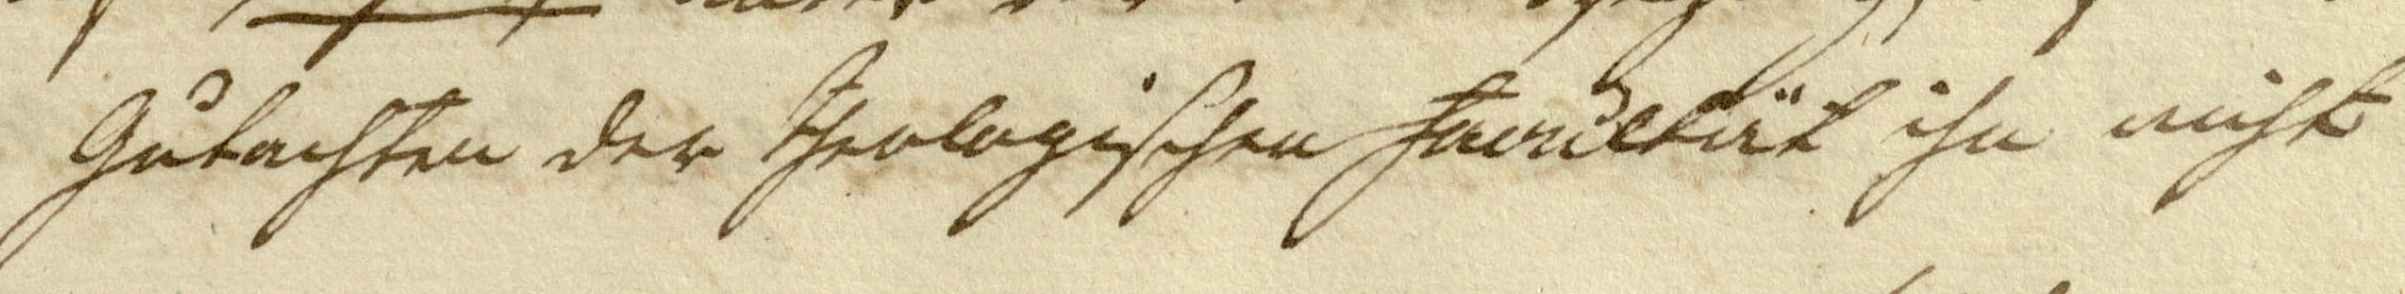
Gutachten der Theologischen Facultät ihn nicht
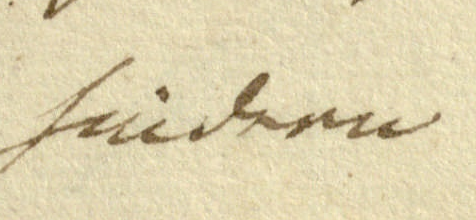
hindern
